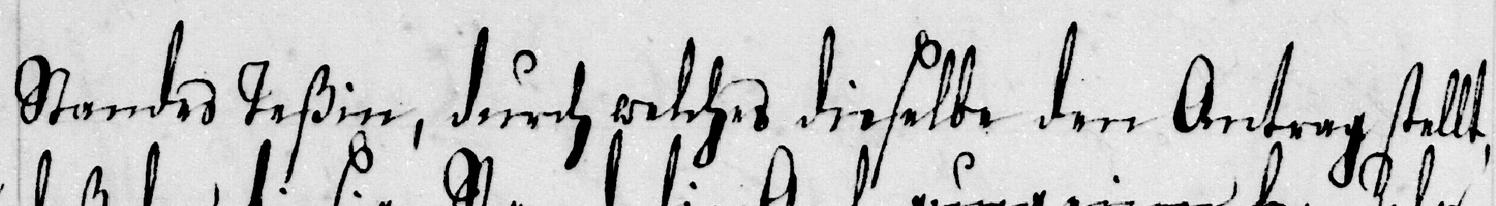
Standes Teßin, durch welches dieselbe den Antrag stell¬
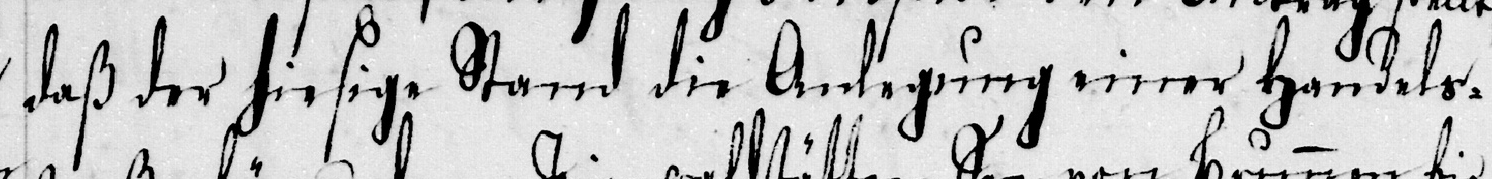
daß der hiesige Stand die Anlegung einer Handels¬
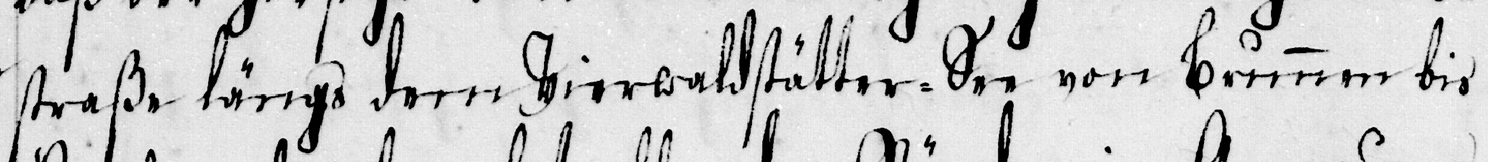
straße längs dem Vierwaldstätter-See von Brunnen bis
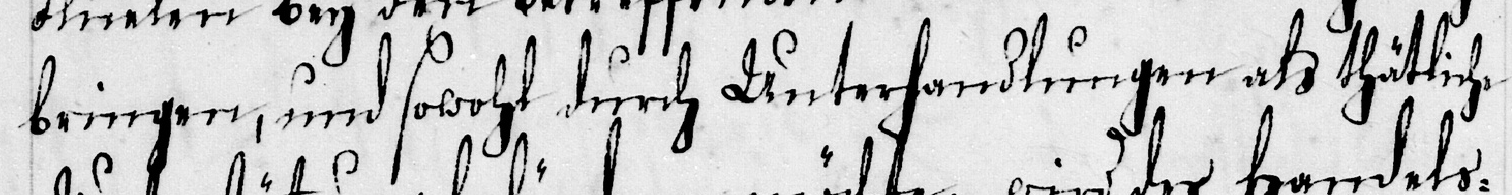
bringen, und sowohl durch Unterhandlungen als thätliche
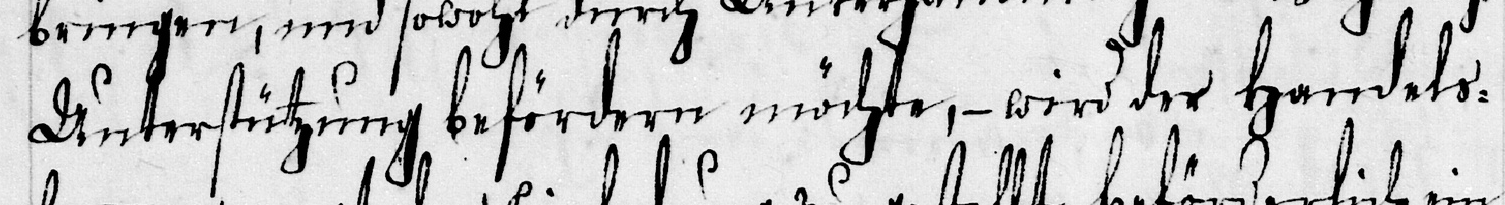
Unterstützung befördern möchte, – wird der Handels¬
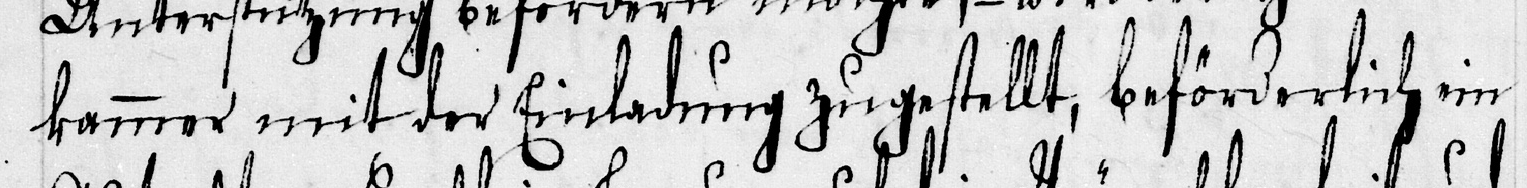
kammer mit der Einladung zugestellt, beförderlich ein
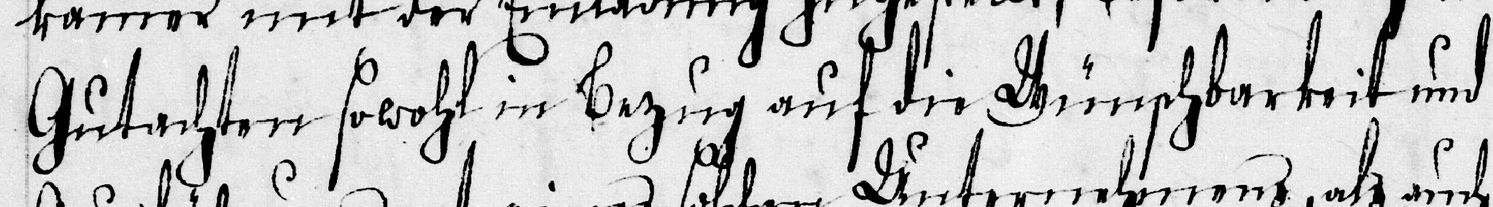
Gutachten sowohl in Bezug auf die Wünschbarkeit und
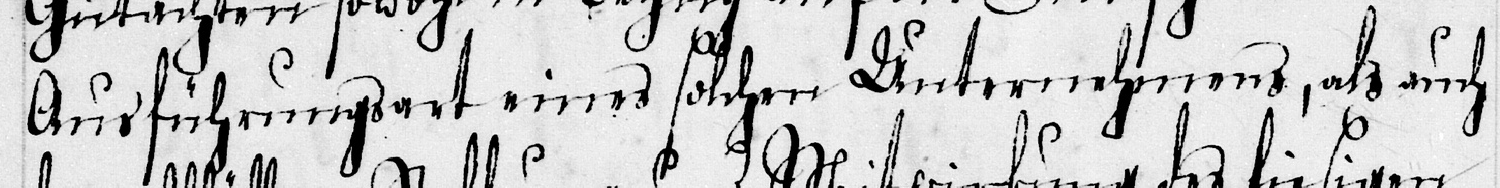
Ausführungsart eines solchen Unternehmens, als auch
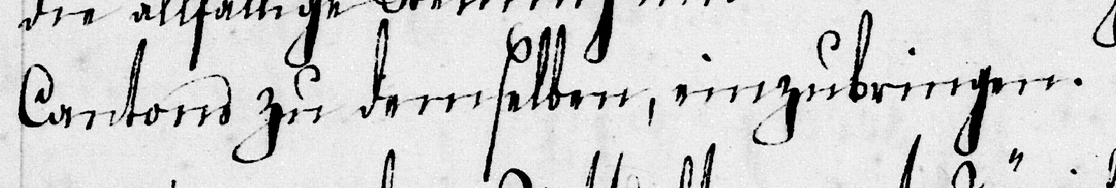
Cantons zu demselben, einzubringen.
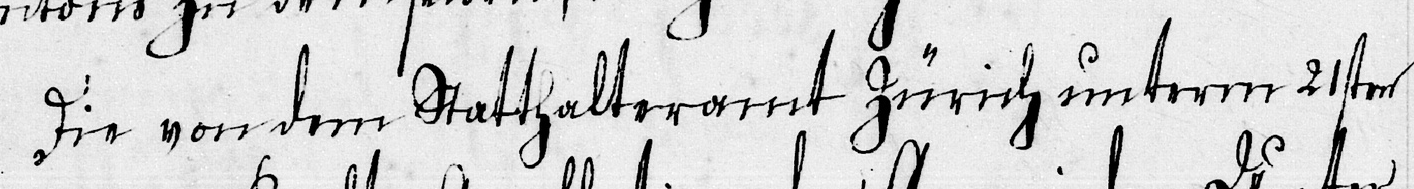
Die von dem Statthalteramt Zürich unterm 21sten
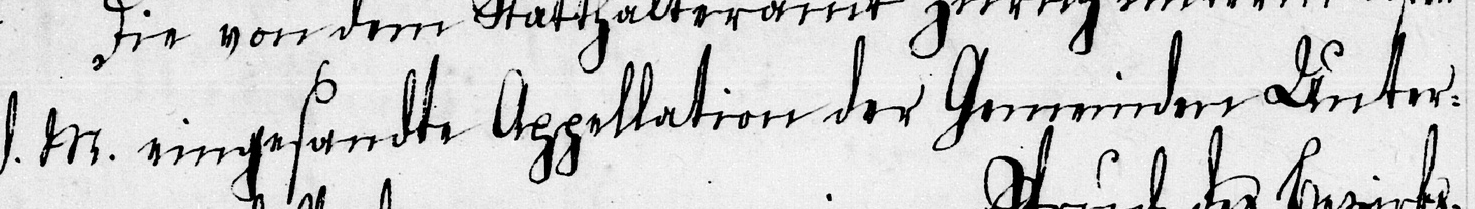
d. M. eingesandte Appellation der Gemeinden Unter¬
